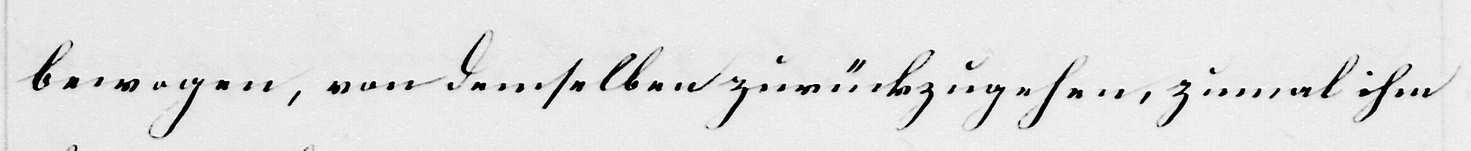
bewogen, von demselben zurückzugehen, zumal ihm
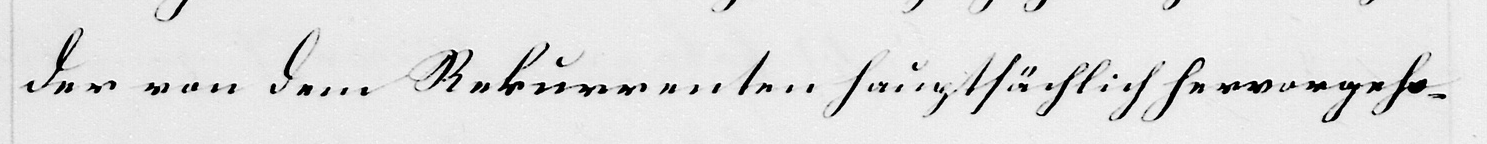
der von dem Rekurrenten hauptsächlich hervorgeho¬
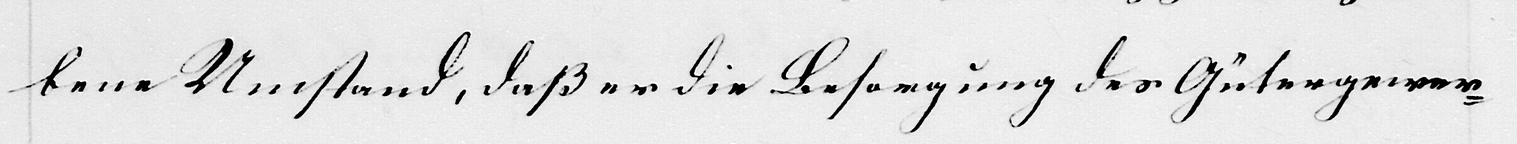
bene Umstand, daß er die Besorgung des Gütergewer¬
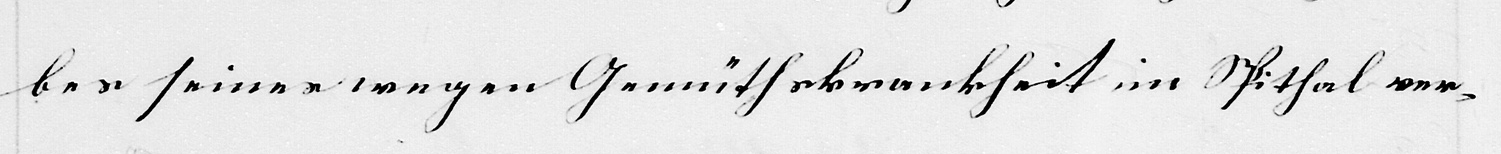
bes seines wegen Gemüthskrankheit im Spithal ver¬
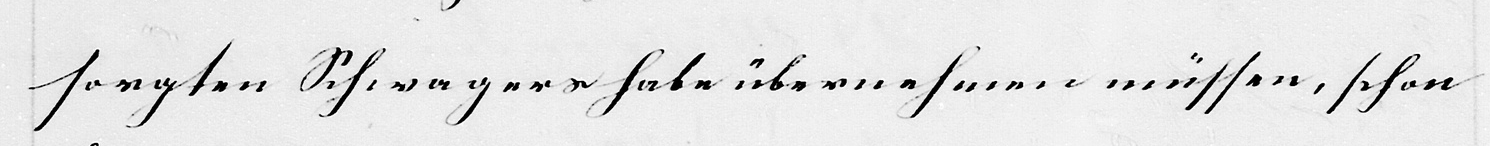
sorgten Schwagers habe übernehmen müssen. schon
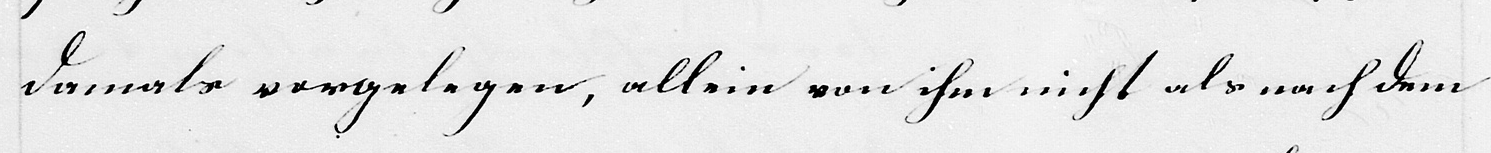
damals vorgelegen, allein von ihm nicht als nach dem
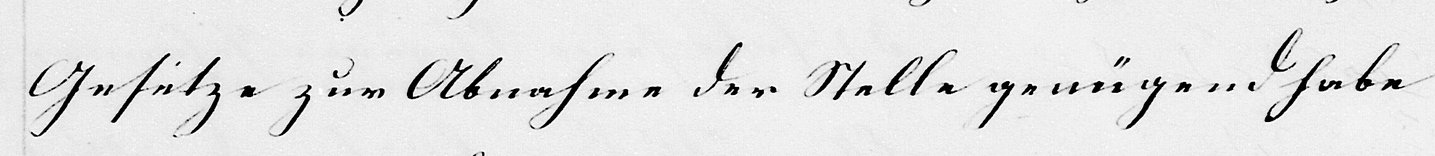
Gesetze zur Abnahme der Stelle genügend habe
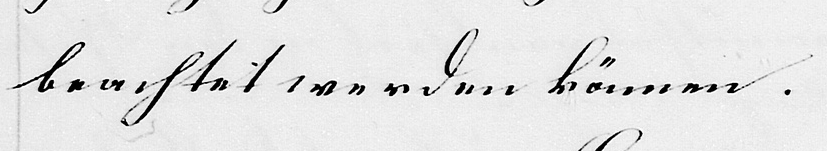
beachtet werden können.
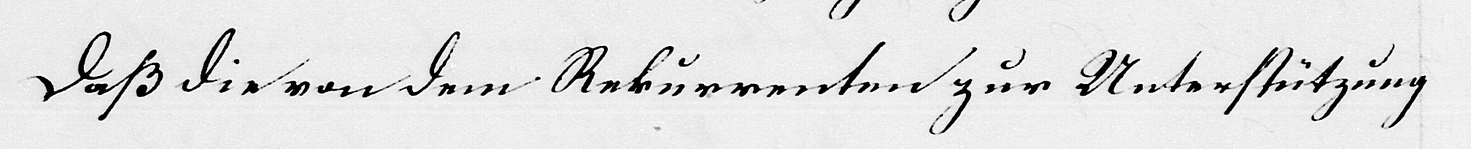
Daß die von dem Rekurrenten zur Unterstützung
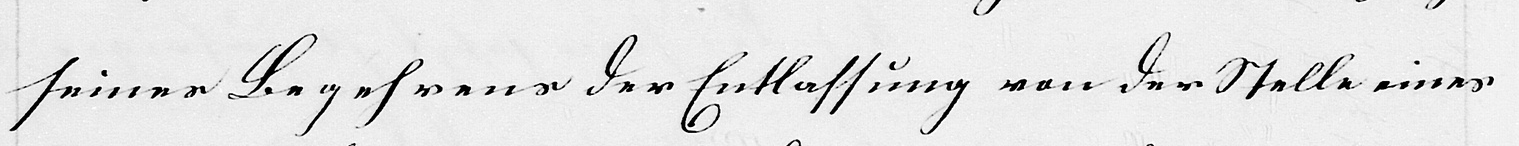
seines Begehrens der Entlassung von der Stelle eines
